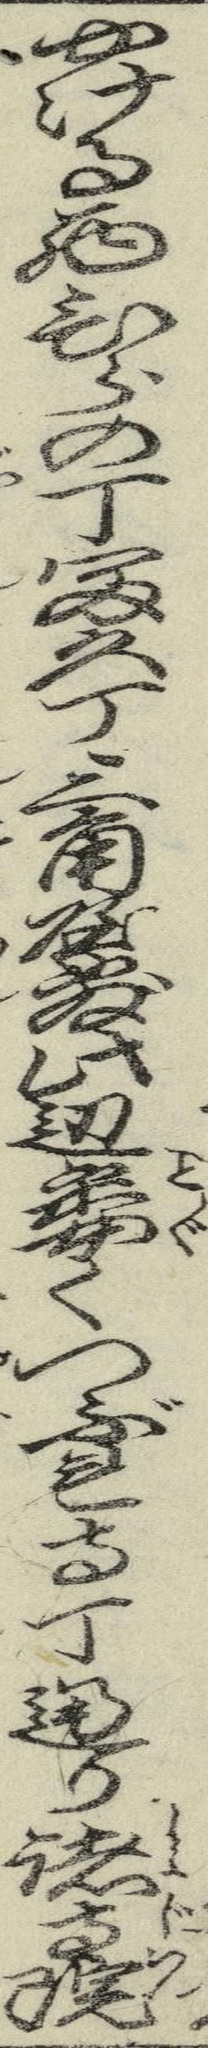やける西ひらの丁富久丁三角屋敷此辺悉くつぶれ寺丁通り諸寺院
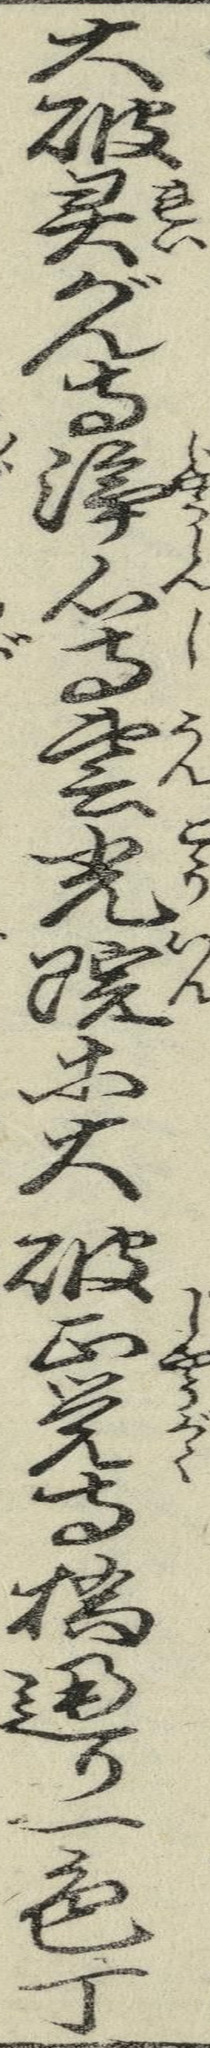大破霊がん寺浄心寺雲光院等大破正覚寺橋通り一色丁
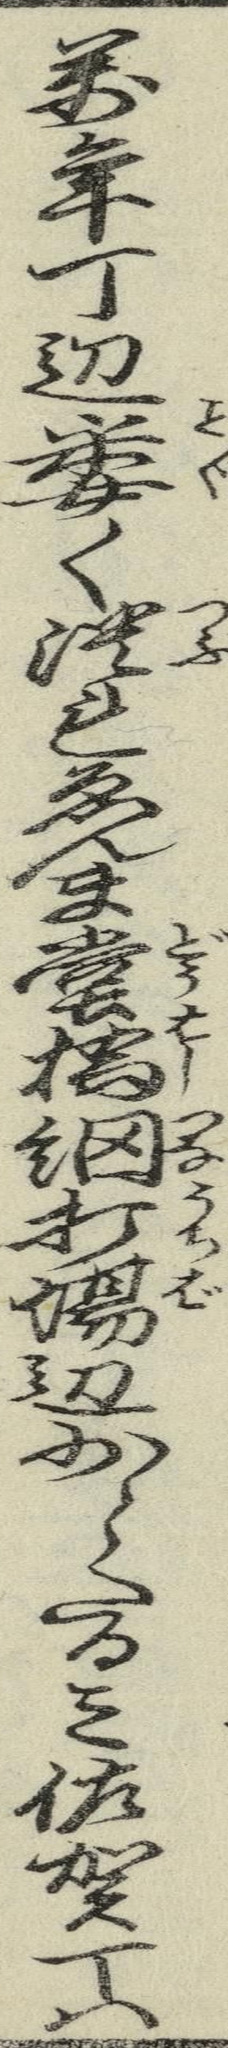万年丁辺悉く潰れゑんま堂橋綱打場辺少したるみ佐賀丁は
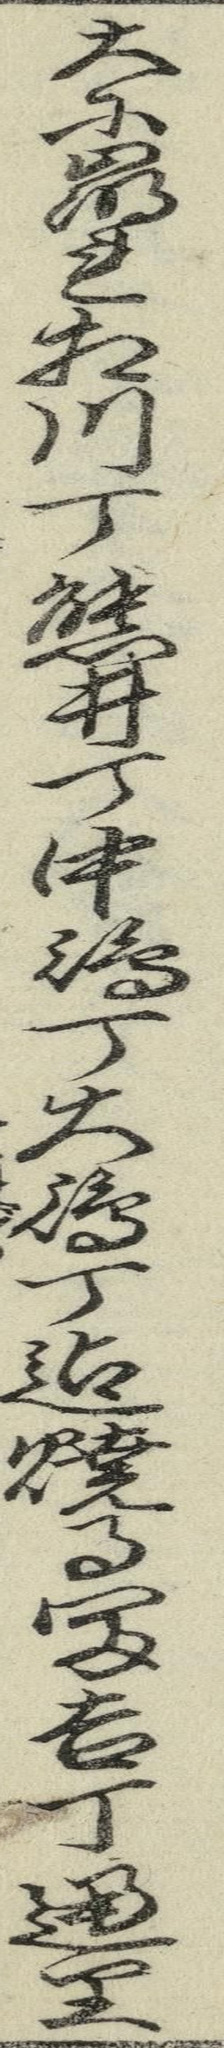大小崩れ相川丁熊井丁中嶋丁大嶋丁迄焼る富吉丁通り
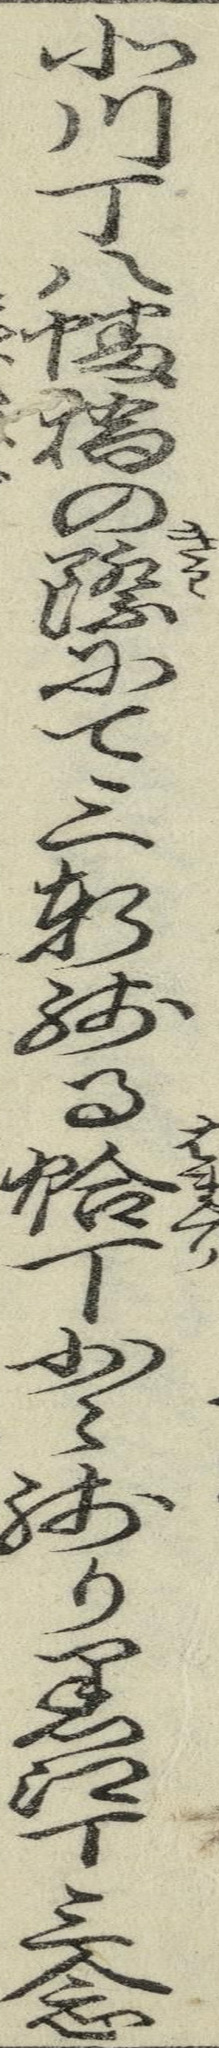北川丁八幡橋の際にて三軒残る蛤丁少々残り黒江丁三念
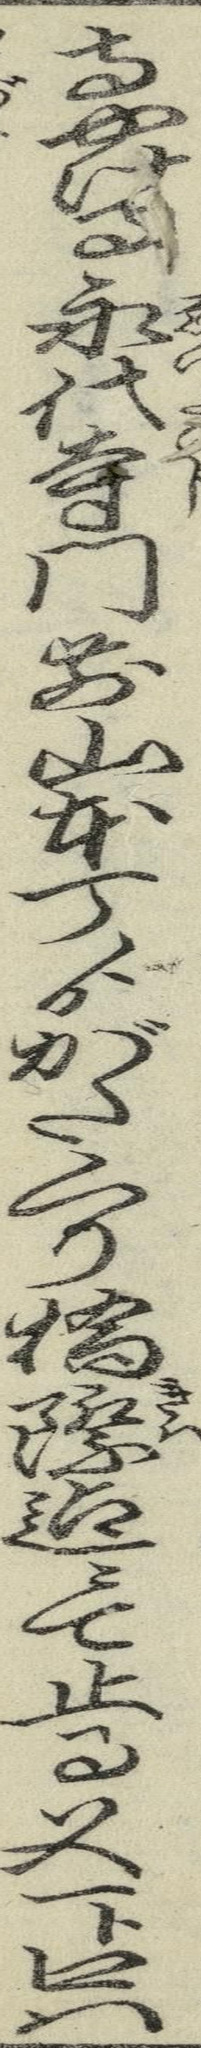寺やける永代寺門前山本丁ゟがたくり橋際迄ニて止る又一ト口は
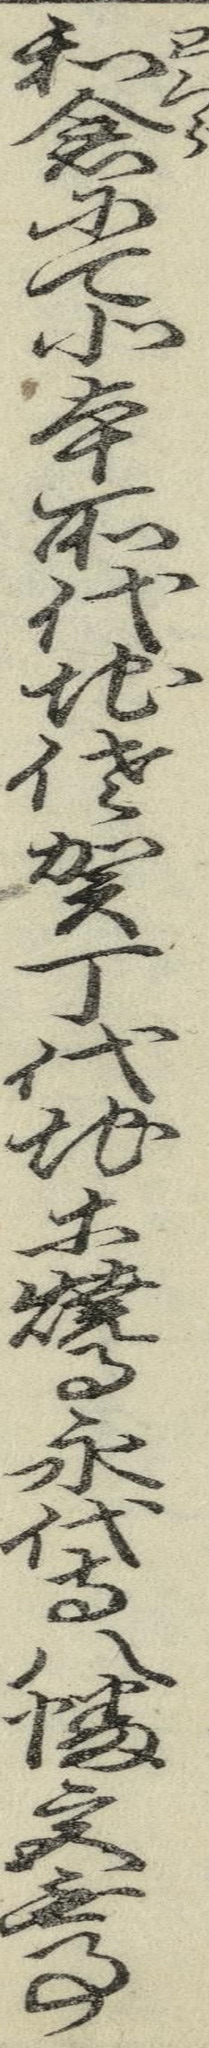和倉にて北本所代地佐賀丁代地等焼る永代寺八幡宮無事
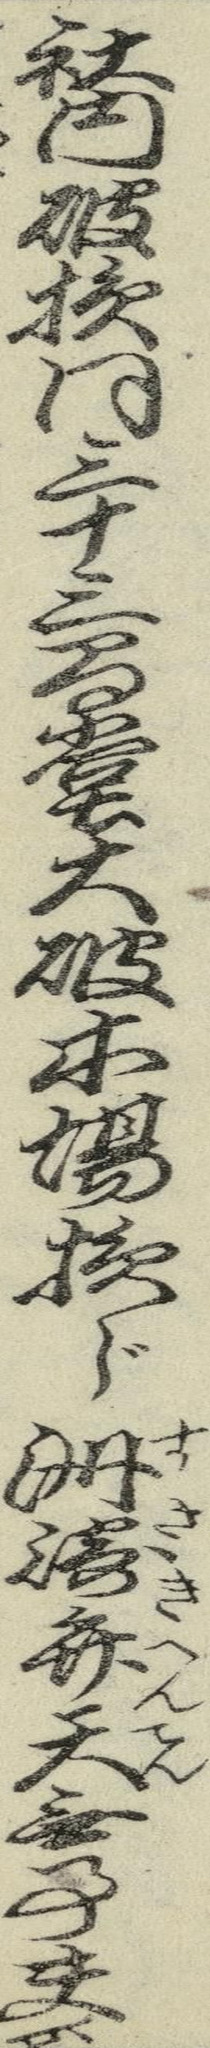社内破損同三十三間堂大破木場損じ洲崎弁天無事夫ゟ
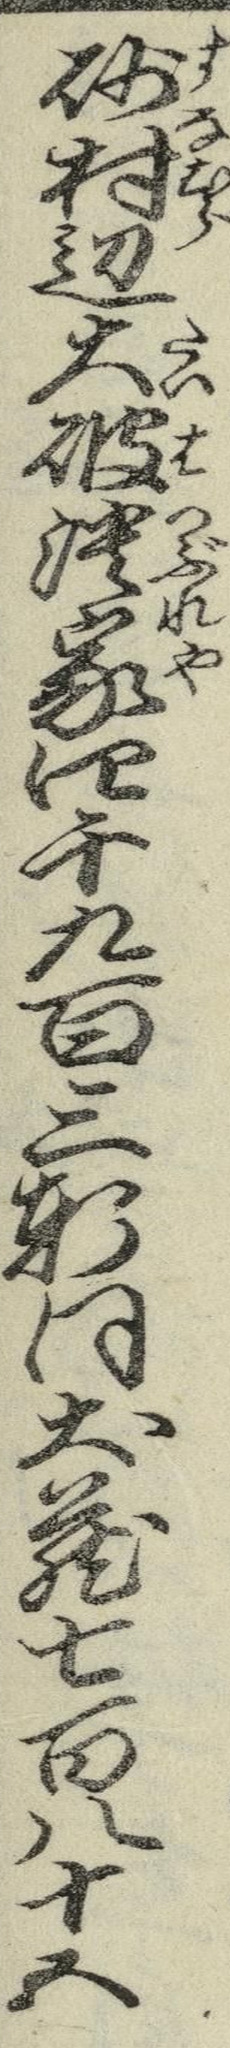砂村辺大破潰家四千九百三軒同土蔵七百八十五
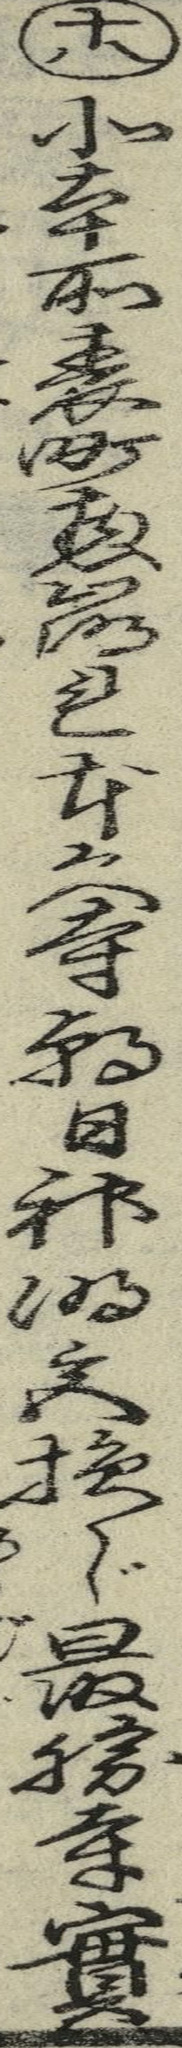十八北本所裏町惣潰れ本久寺朝日神明宮損じ最勝寺実
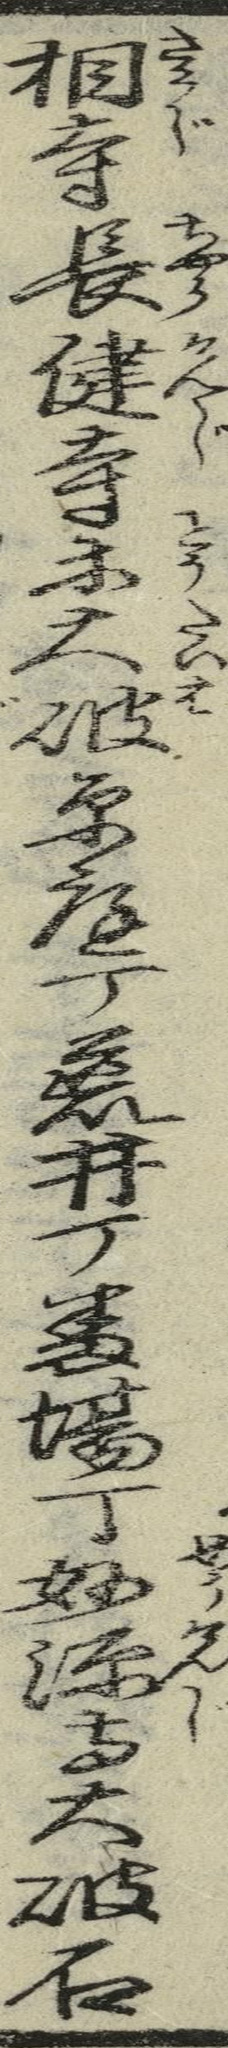相寺長健寺等大破原庭丁荒井丁番場丁妙源寺大破石
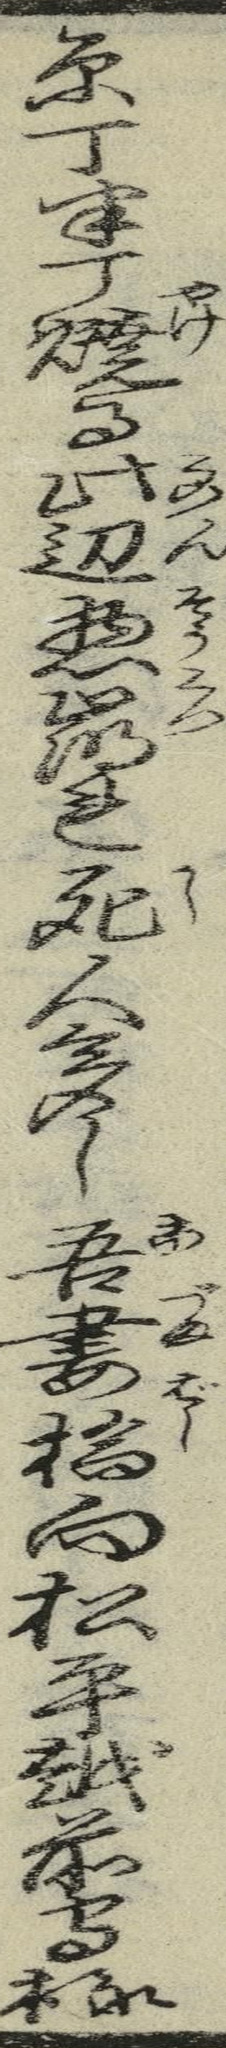原丁半丁焼る此辺惣崩れ死人多し吾妻橋向松平越前守様
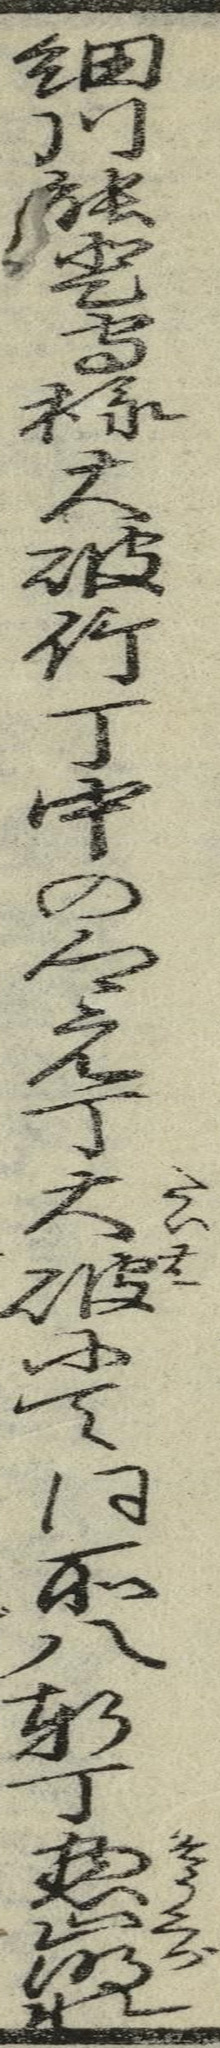細川能登守様大破竹丁中の郷元丁大破にて同所八軒丁惣崩れ
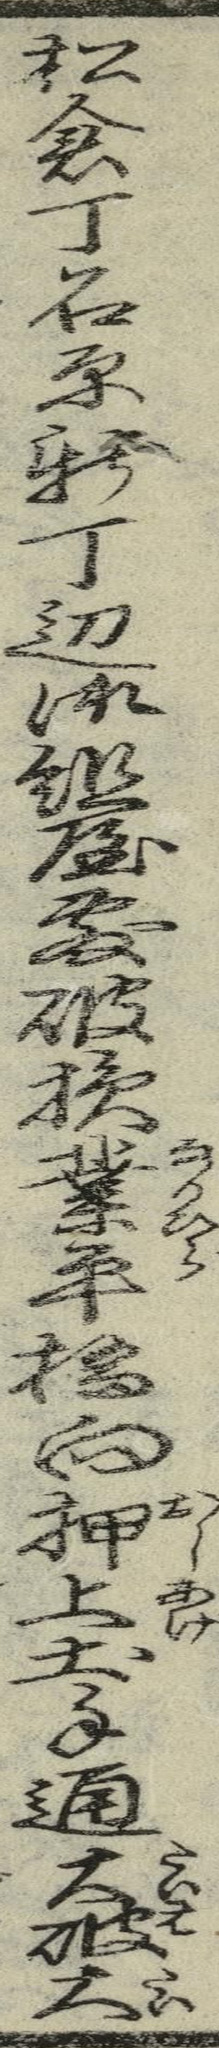松倉丁石原新丁辺御組屋敷破損業平橋向押上土手通大破大
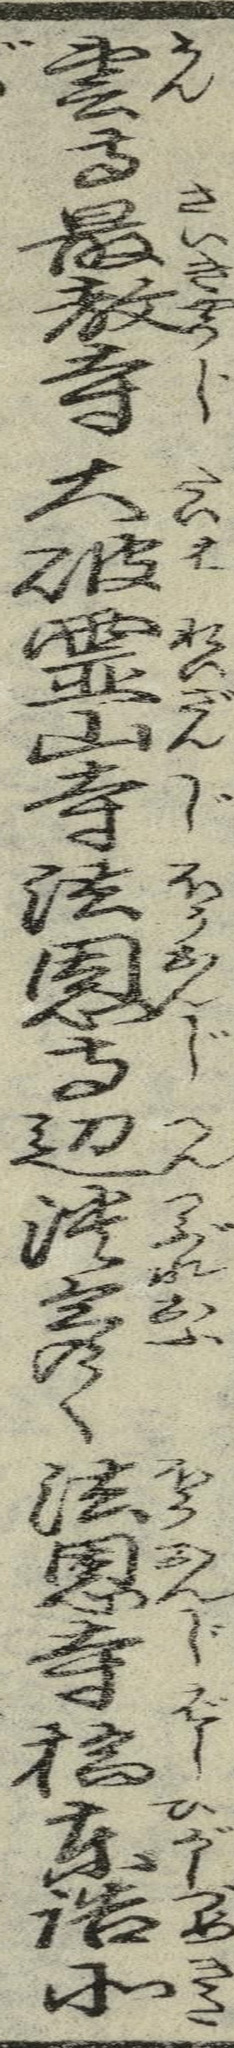雲寺最教寺大破霊山寺法恩寺辺潰多く法恩寺橋東詰北
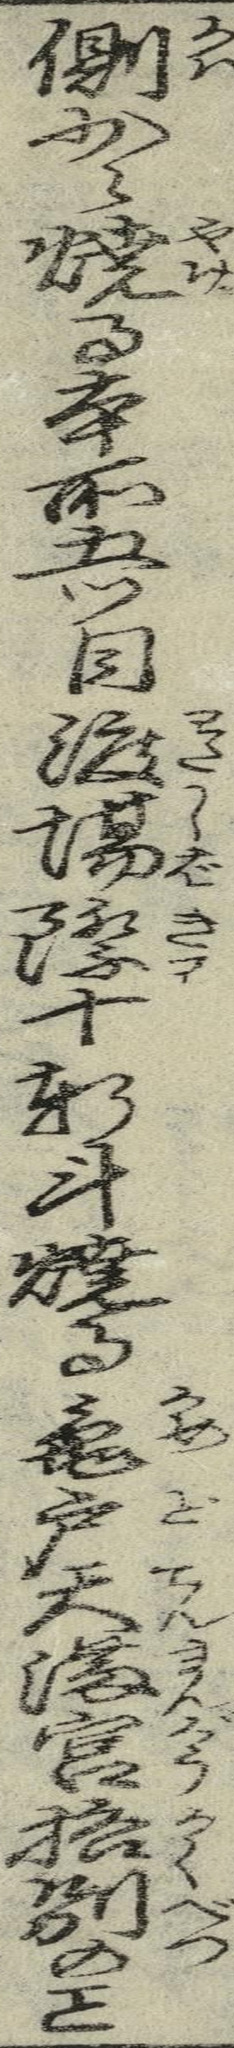側少々焼る本所五ツ目渡場際十軒斗焼る亀戸天満宮格別のこと
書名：地震年代記
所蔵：東京大学地震研究所図書室 Earthquake Research Institute Library, The University of Tokyo, JAPAN
